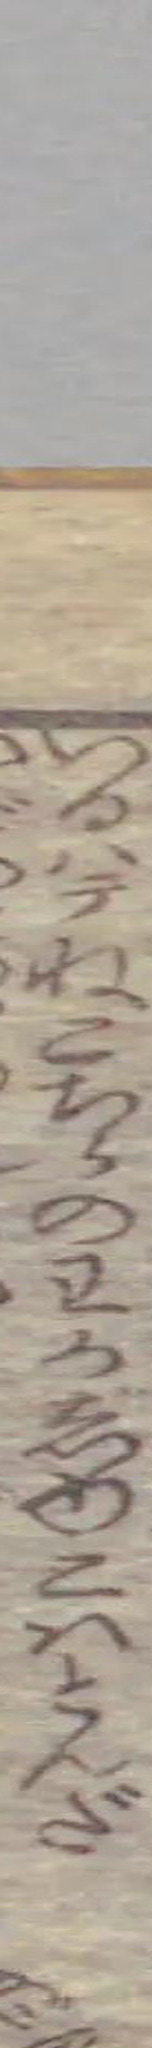いるハテねこちらのわかしゆこはとんだ
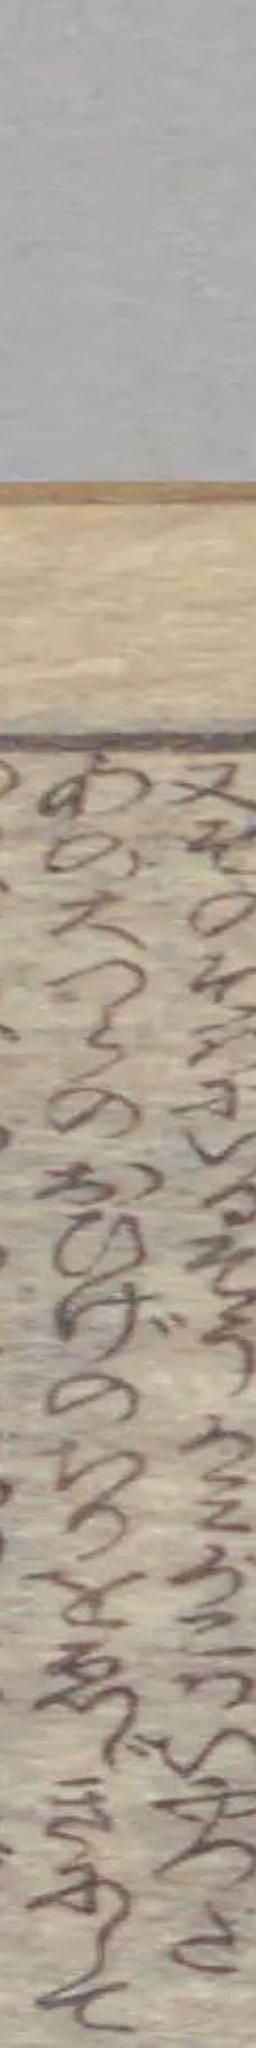あのおゝつらのおひげのちりをゑじきにして
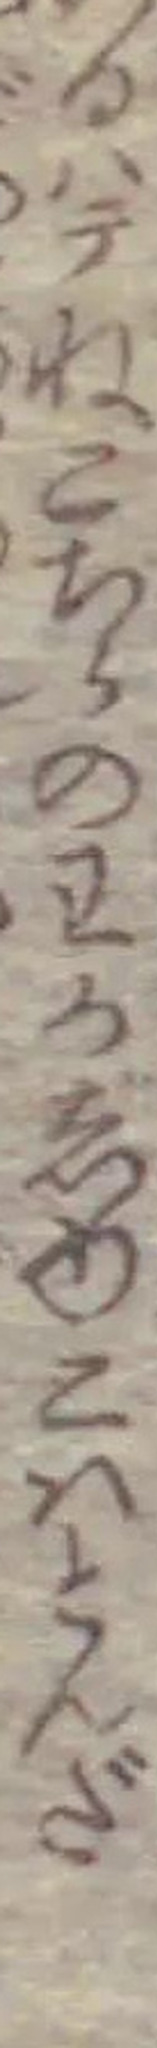いるハテねこちらのわかしゆこはとんだ
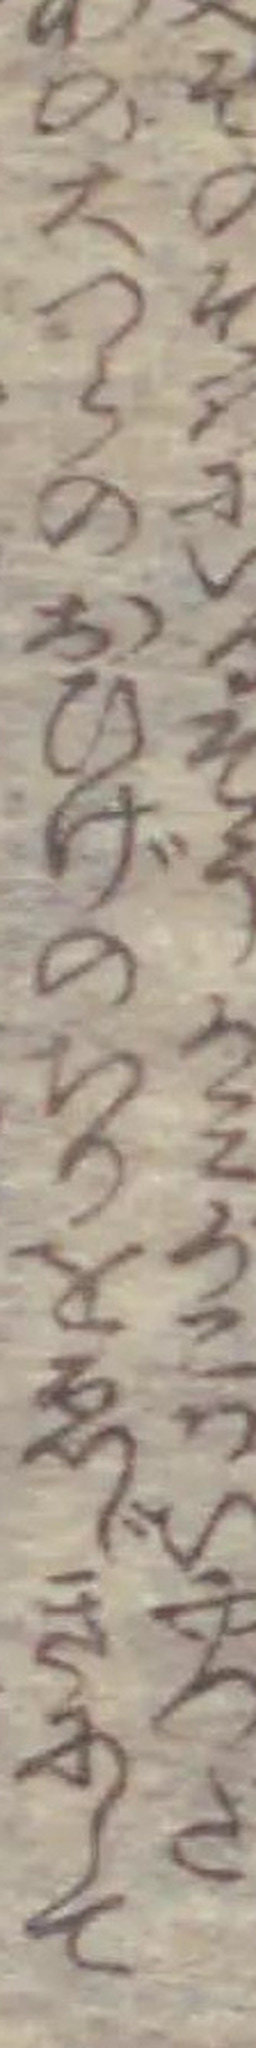あのおゝつらのおひげのちりをゑじきにして

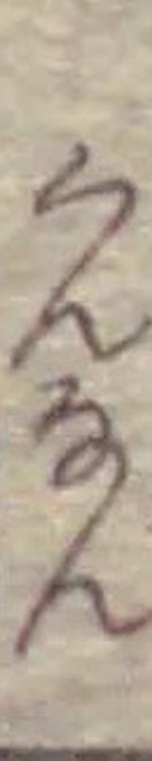くんなん
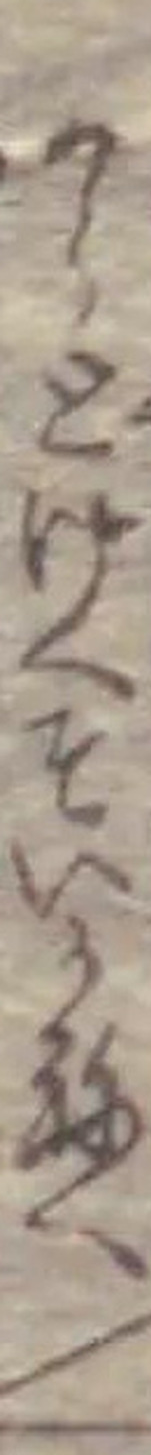からとけへそいかねへ
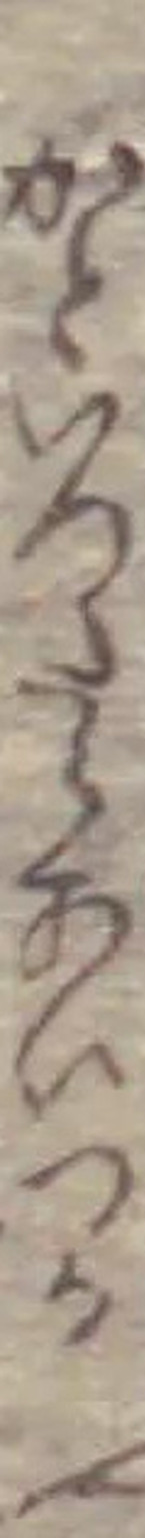かといつたらあいつか
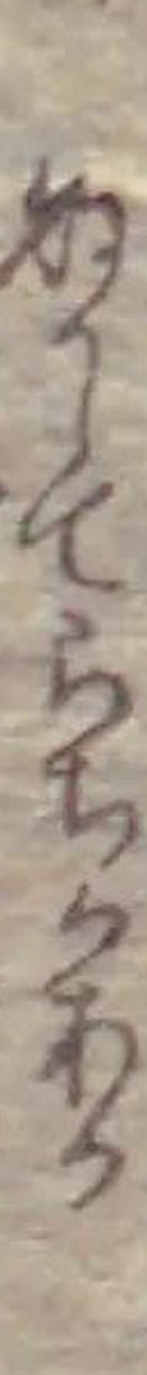ぬかしてらちかあか
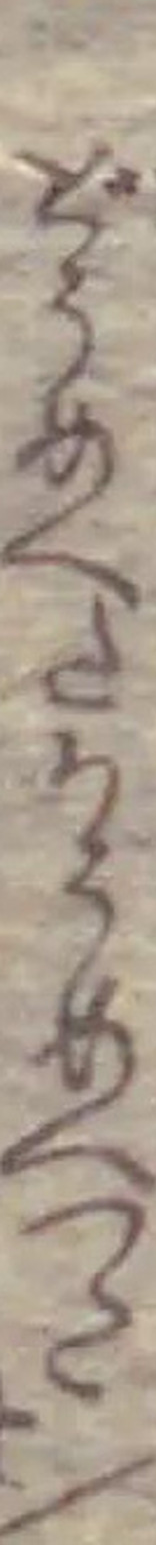どうめへたかうめへつた
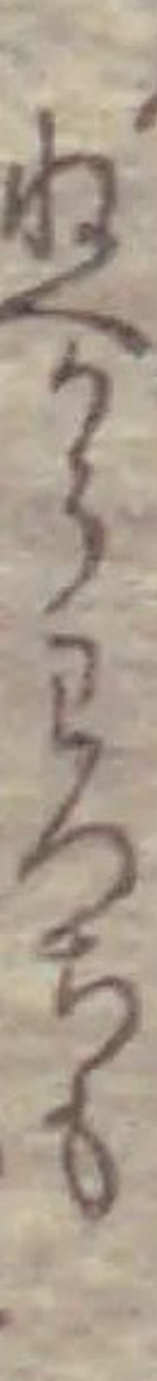ねへからわつちも
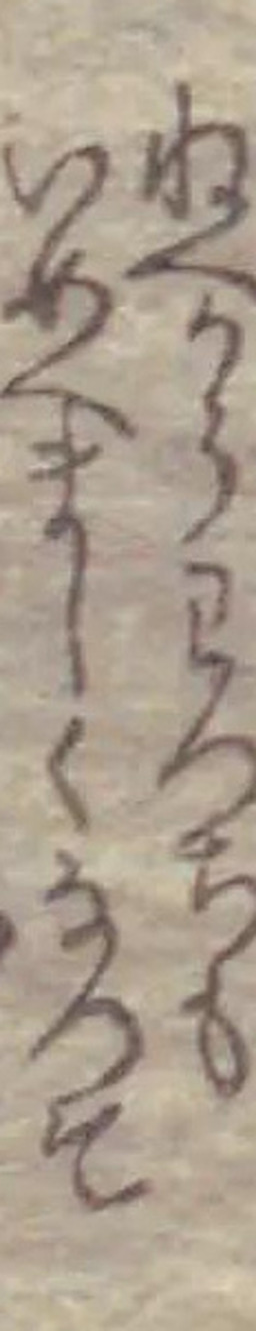いめへましくなつて
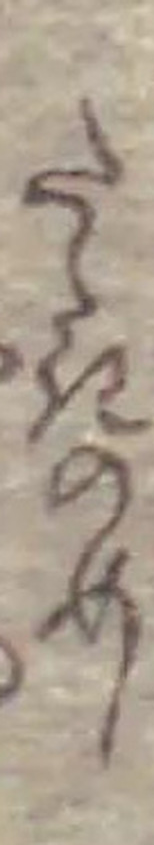たゝきのめし

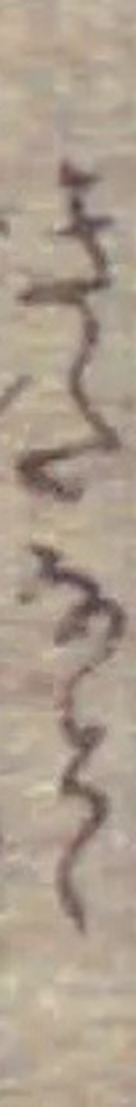きたなとゝ
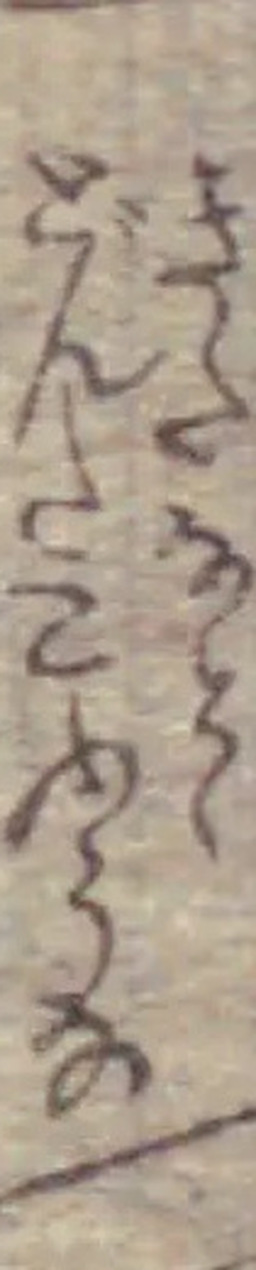どんたこふうな
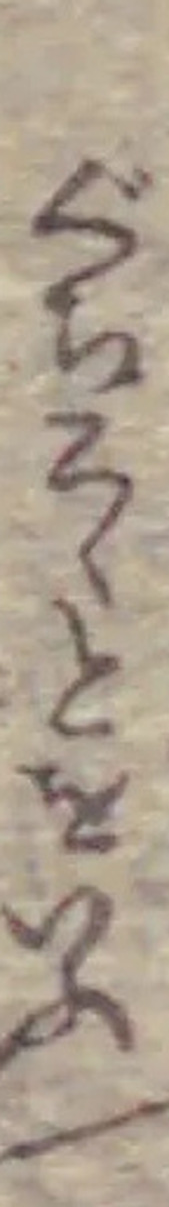ぐちこゝとをいふ
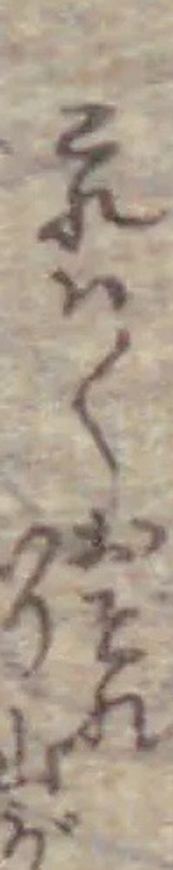これは〳〵おそれ
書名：化物大閉口 2巻
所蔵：国立国会図書館 National Diet Library, JAPAN
